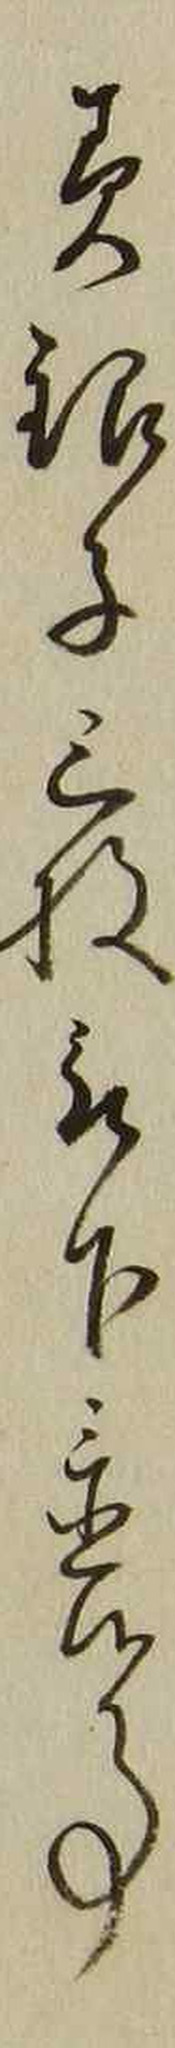美銀子三枚被下置候事
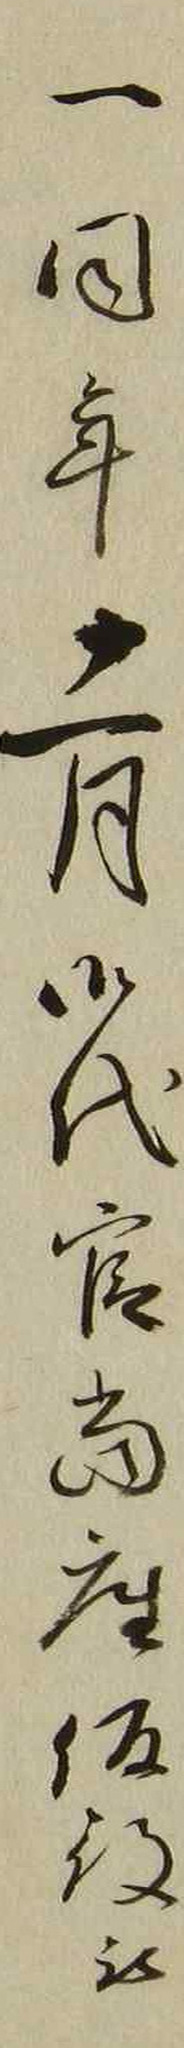一同年十一月御代官当座仮役被
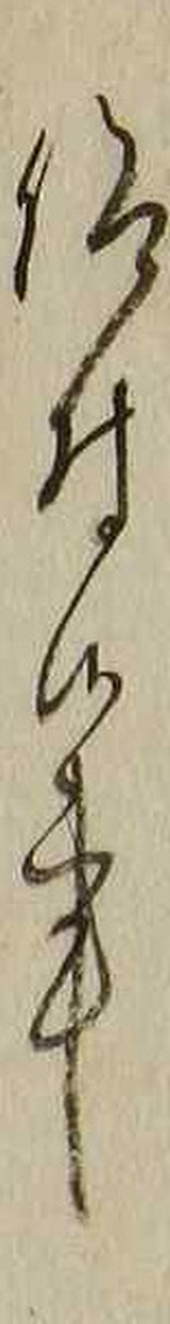仰付候事
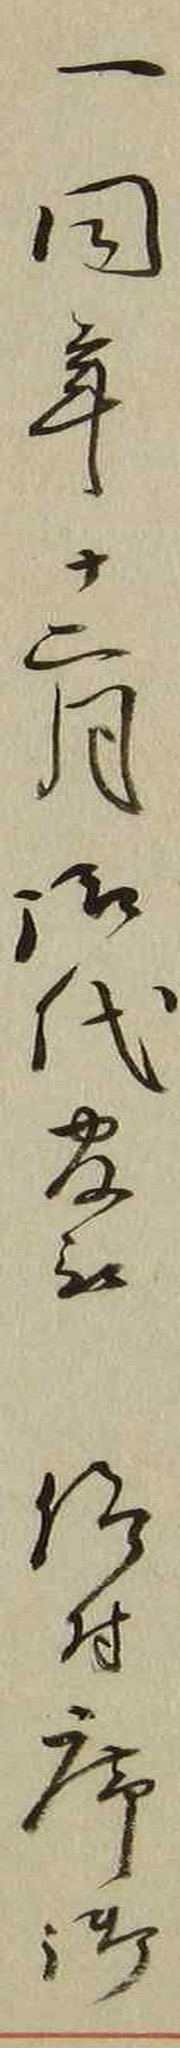一同年十二月御代官被仰付席御
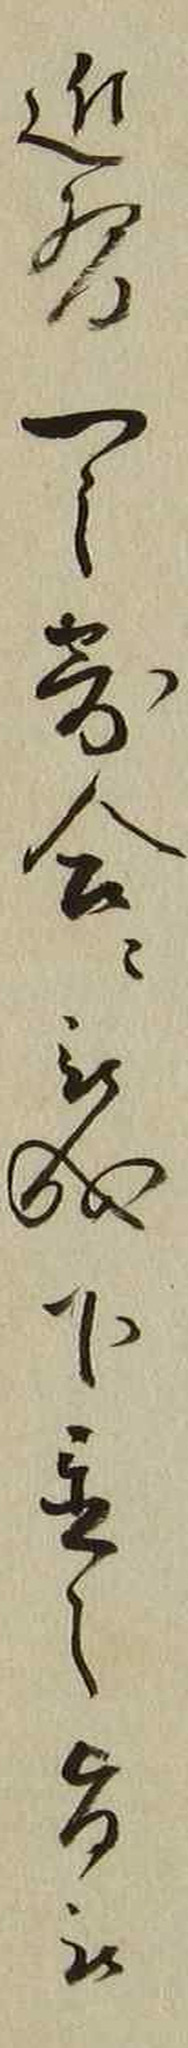近習一之寄合に被成下置之旨被
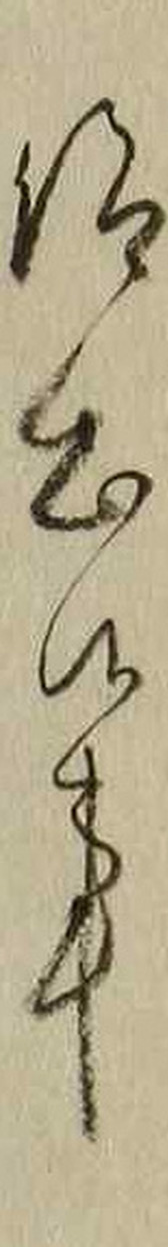仰出候事
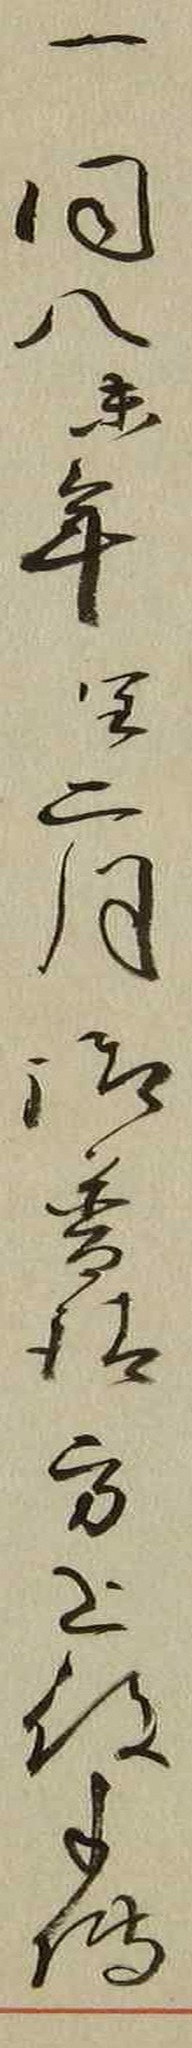一同八未年閏二月御普請方上役手伝
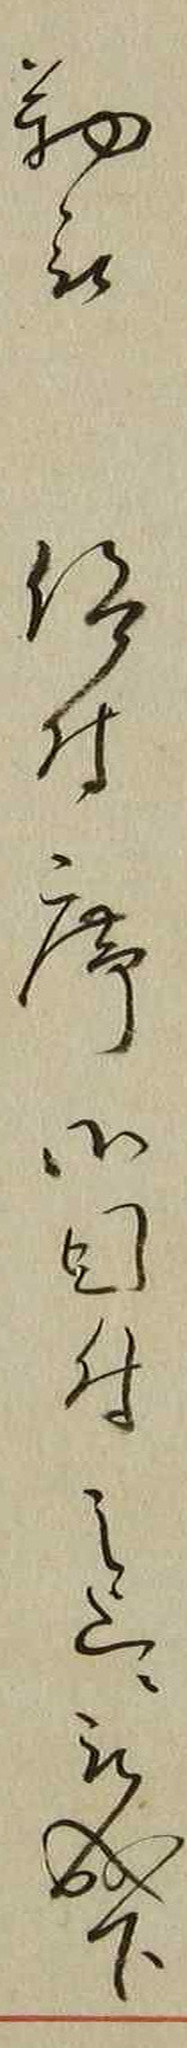勤被仰付席御目付の上に被成下
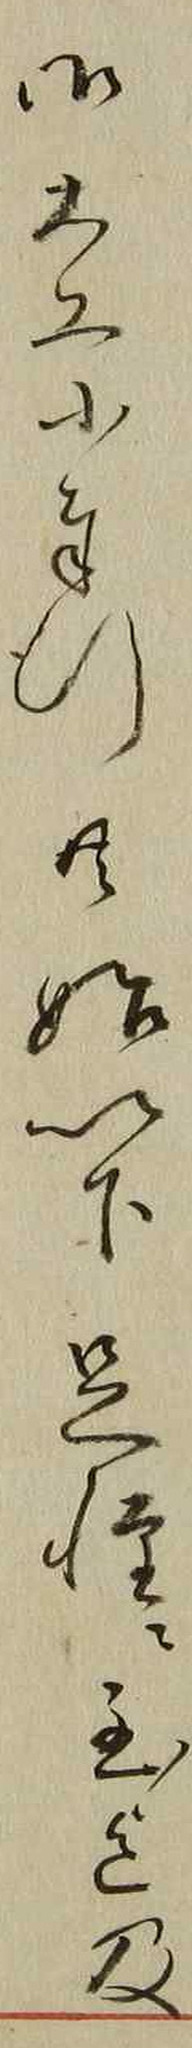御大工小奉行共始以下足軽に至迄及
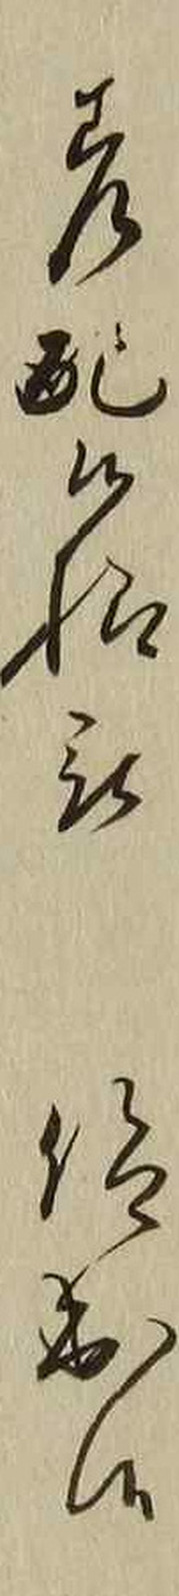差配候様被仰出候
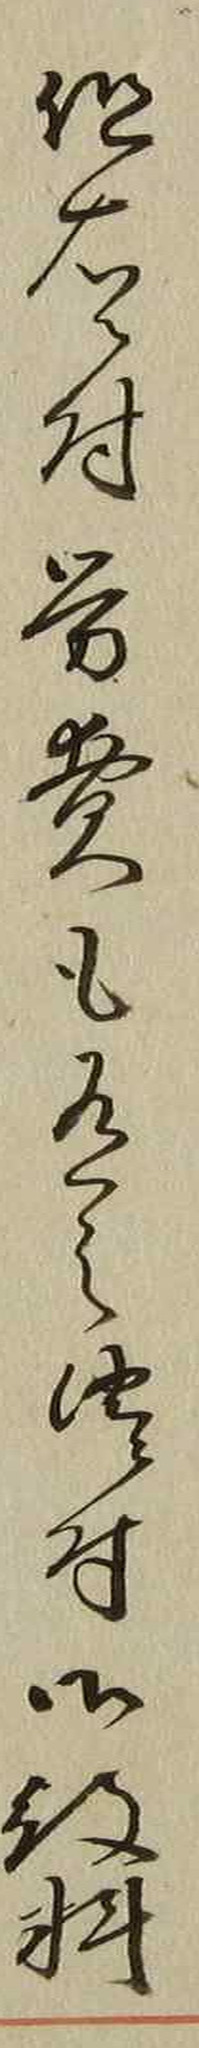但右に付労費も有之由に付御役料
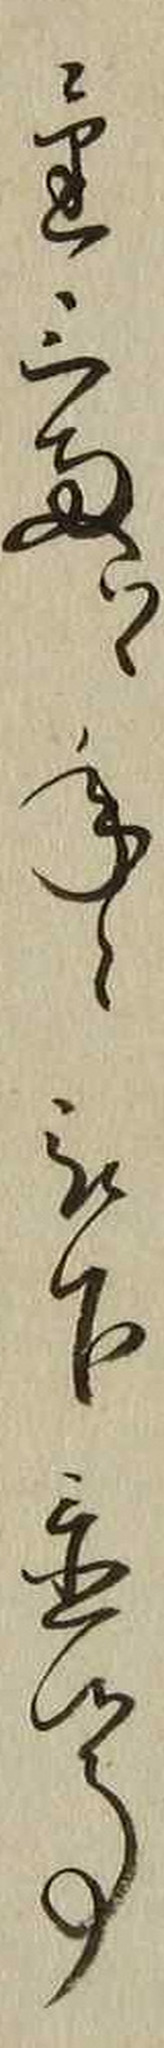金三両ツヽ年々被下置候事
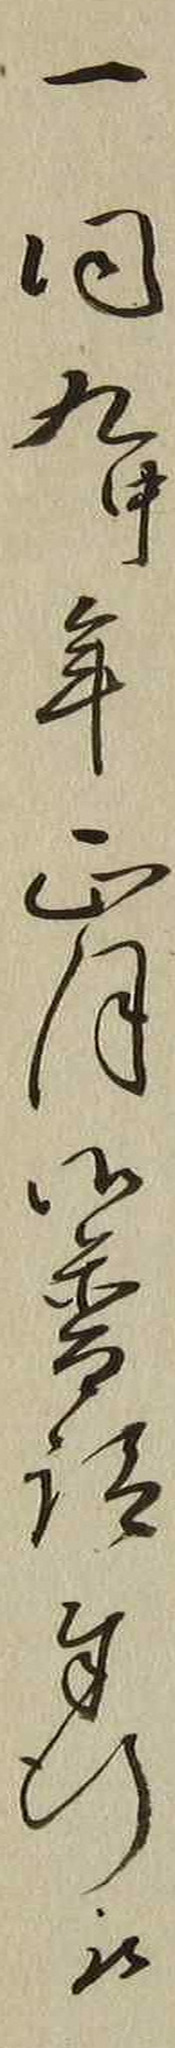一同九申年正月御普請奉行被
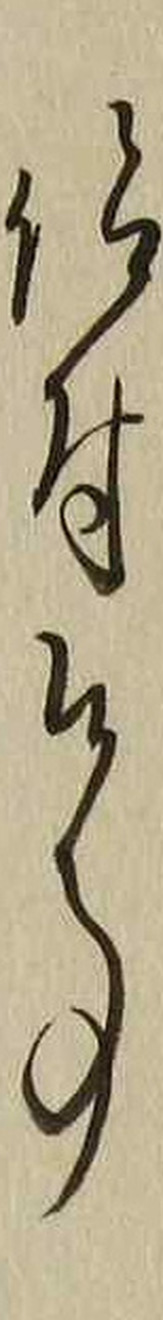仰付候事
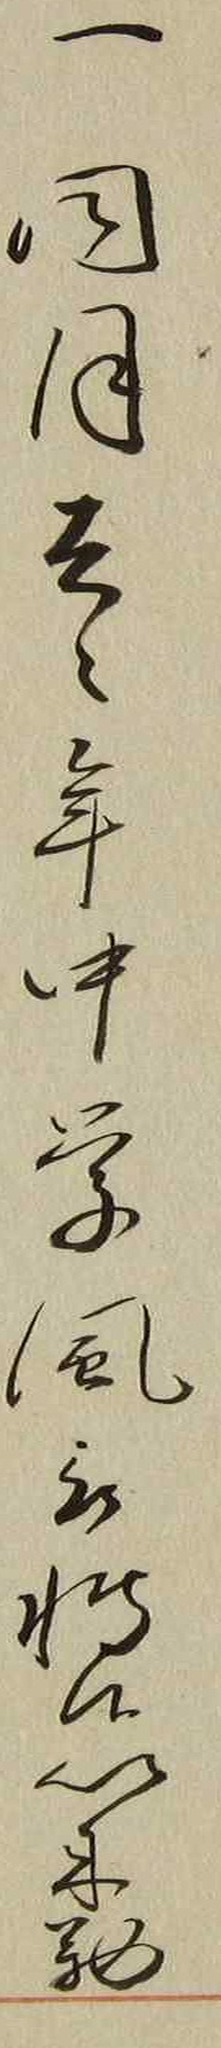一同月去々年中学風被転候以来勤
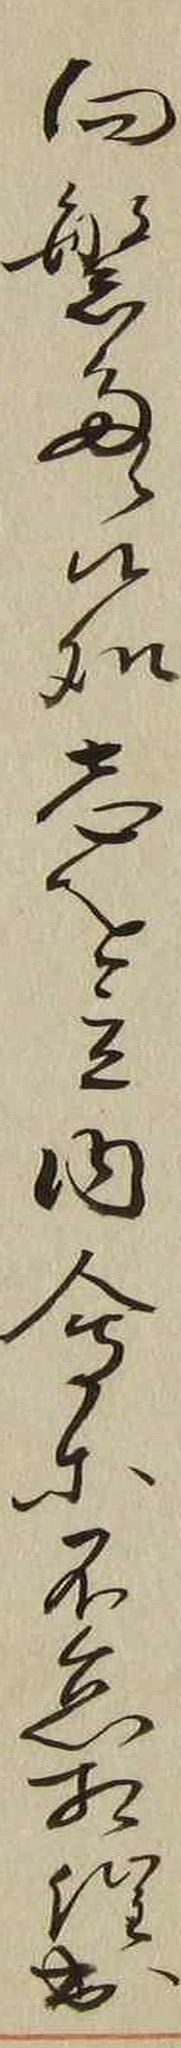向繁多に候処志を立内會等不怠相催出
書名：諸士系譜　巻之3　い之部3
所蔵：会津若松市立会津図書館
